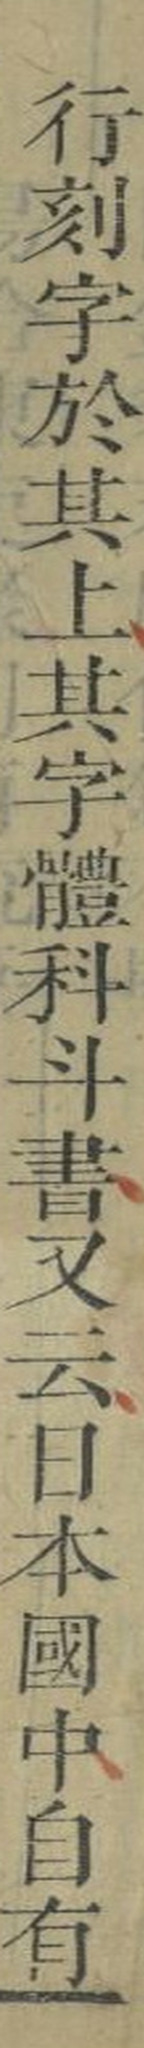行刻字於其上其字体科斗書又云日本国中自有
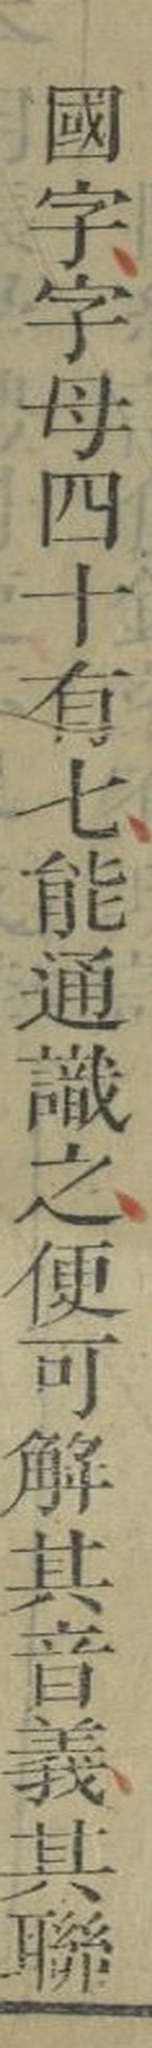国字字母四十有七能通識之便可解其音義其聯
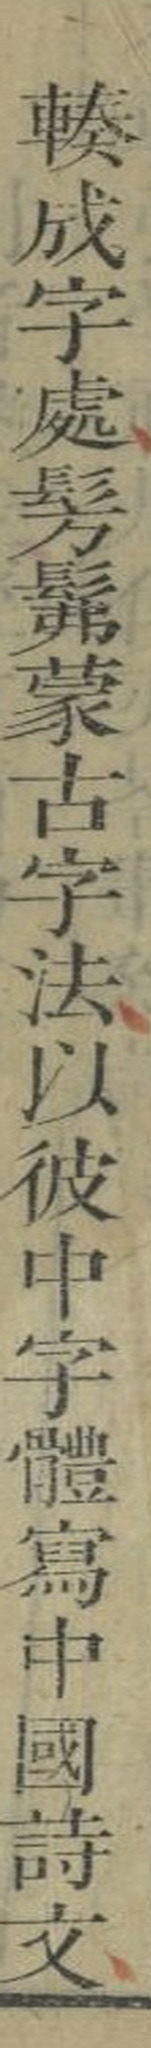輳成字処髣髴蒙古字法以彼中字体写中国詩文
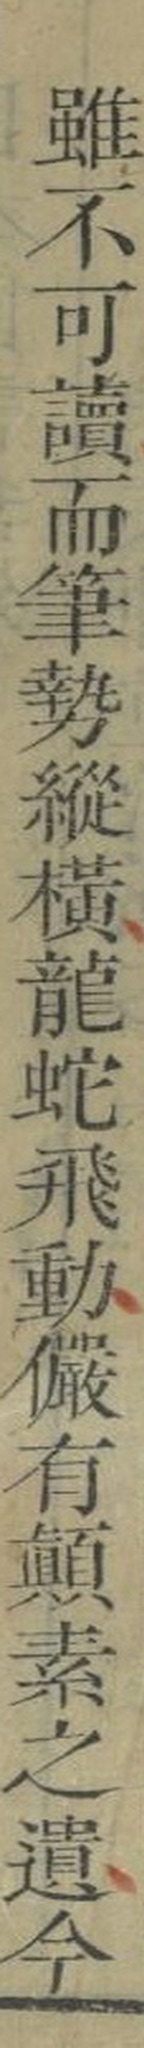雖不可読而筆勢縦横竜蛇飛動儼有顚素之遺今
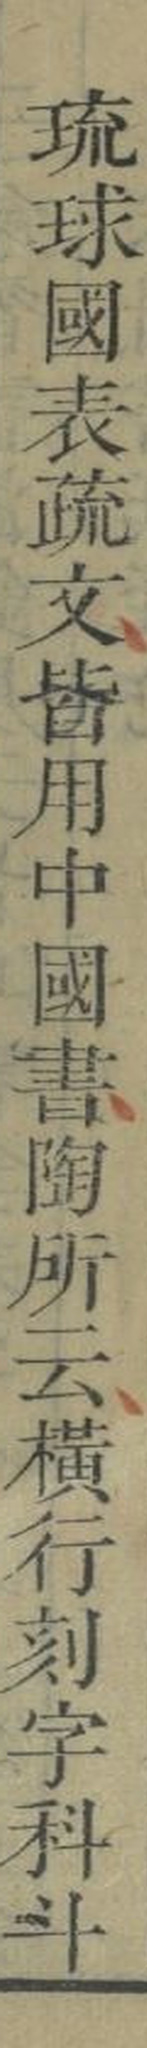琉球国表疏文皆用中国書陶所云横行刻字科斗
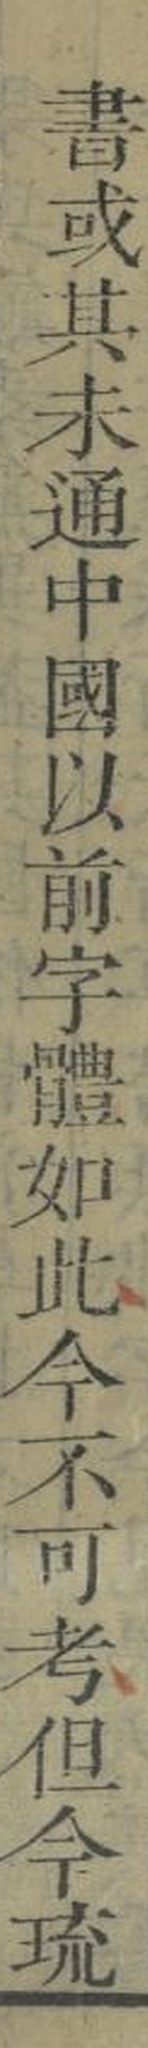書或其未通中国以前字体如此今不可考但今琉
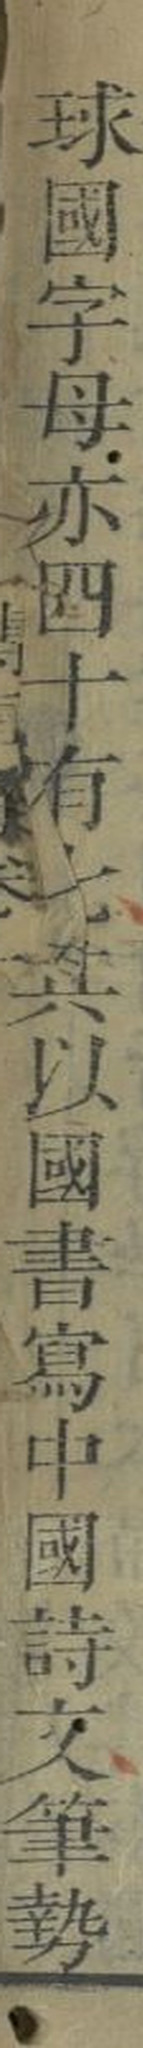球国字母亦四十有七其以国書写中国詩文筆勢

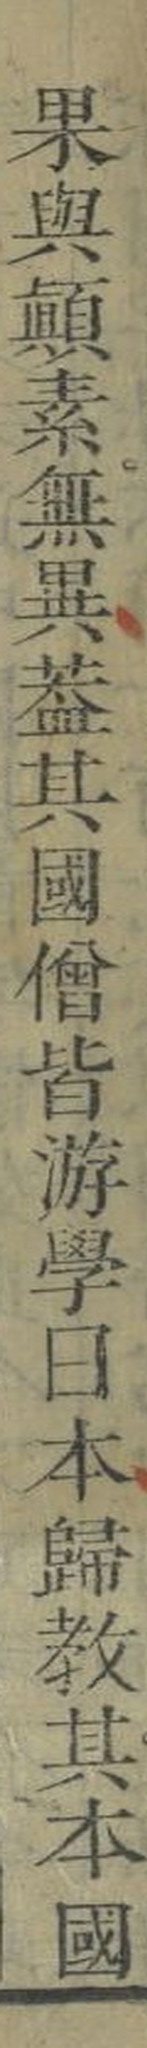果与顚素無異葢其国僧皆游学日本帰教其本国
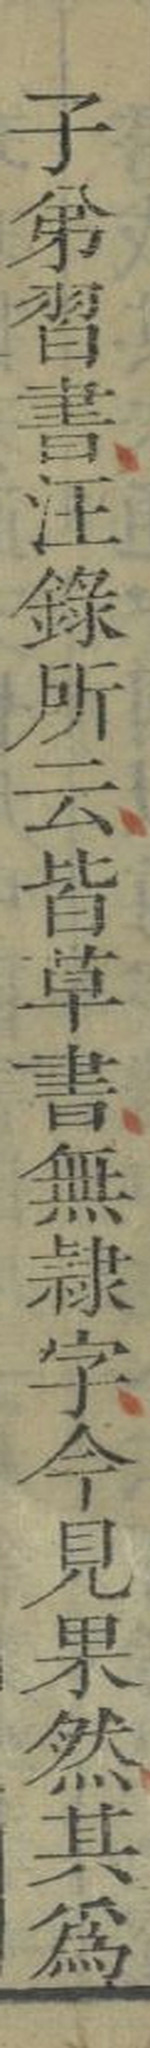子弟習書汪録所云皆草書無隷字今見果然其為
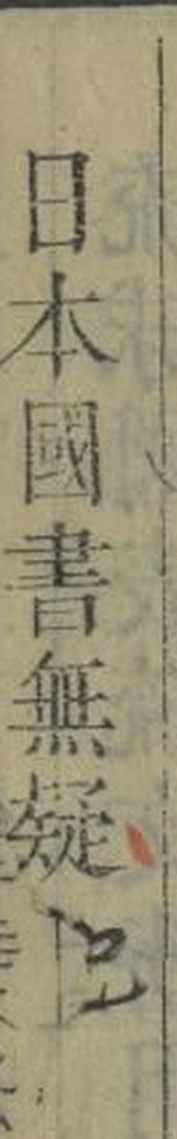日本国書無疑
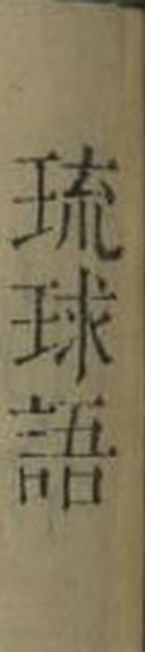琉球語
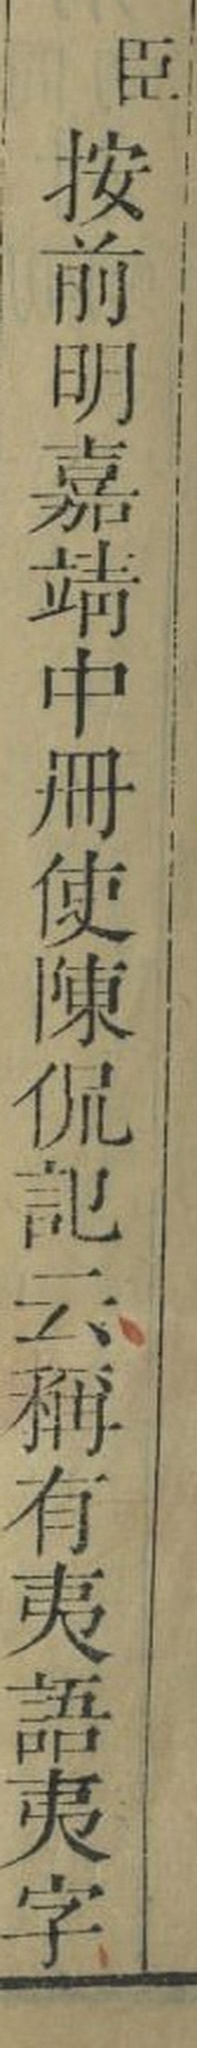臣按前明嘉靖中冊使陳侃記云称有夷語夷字
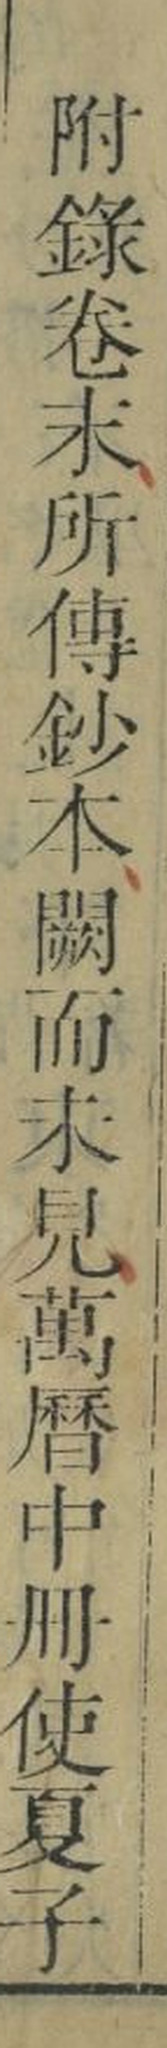附録巻末所伝鈔本闕而未見万暦中冊使夏子
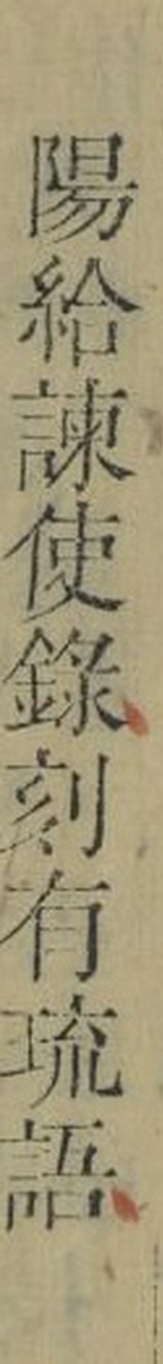陽給諫使録刻有琉語
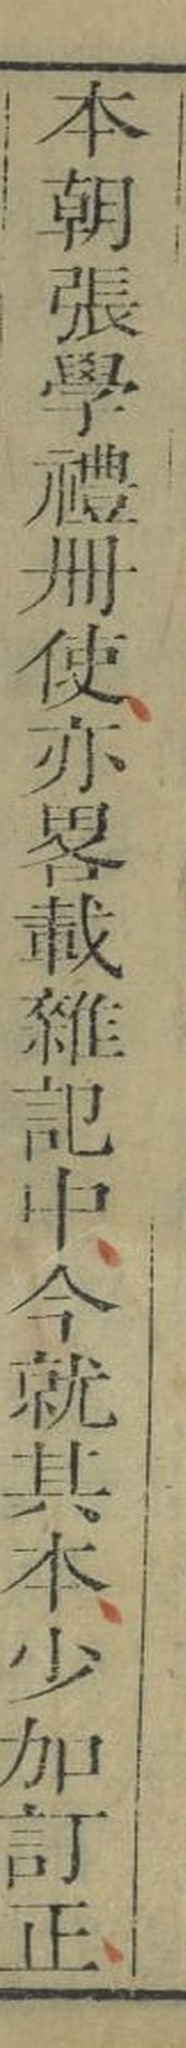本朝張学礼冊使亦略載雑記中今就其本少加訂正
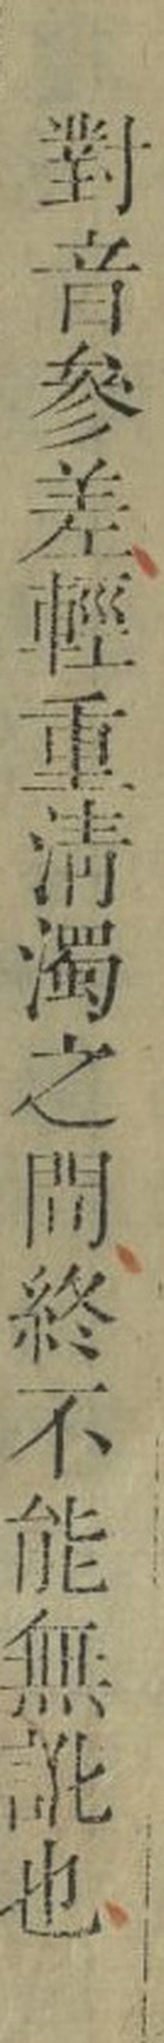対音参差軽重清濁之間終不能無訛也
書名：中山伝信録 巻六
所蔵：University of the Ryukyus Library
